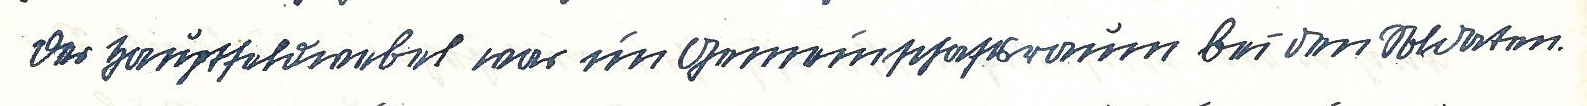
Der Hauptfeldwebel war im Gemeinschaftsraum bei den Soldaten.
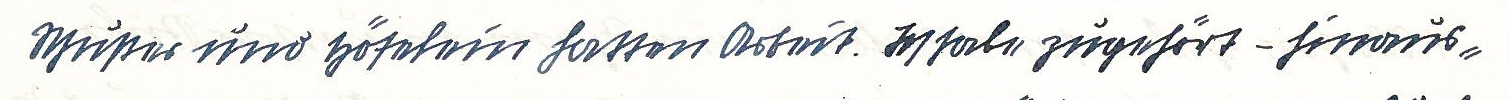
Sch. und H. hatten Arbeit. Ich habe zugehört – hinaus¬
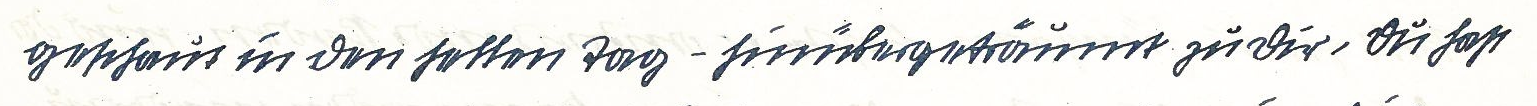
geschaut in den hellen Tag – hinübergeträumt zu Dir, Du hast
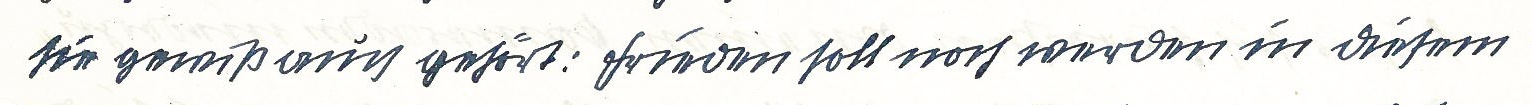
sie gewiß auch gehört: Frieden soll noch werden in diesem
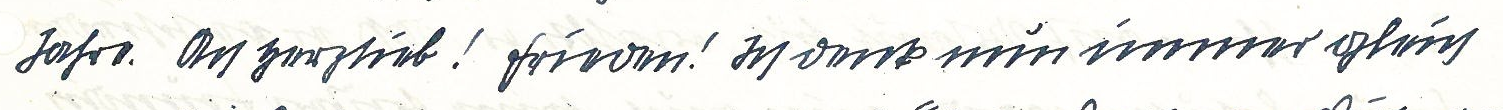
Jahr. Ach Herzlieb! Frieden! Ich denk nun immer
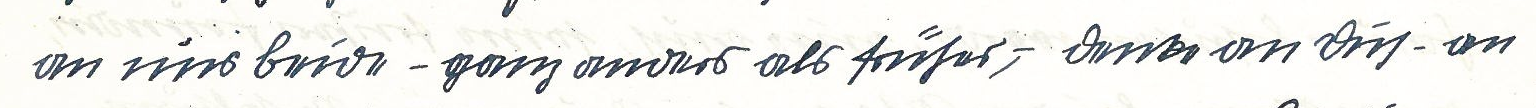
an uns beide – ganz anders als früher, – denke an Dich – an
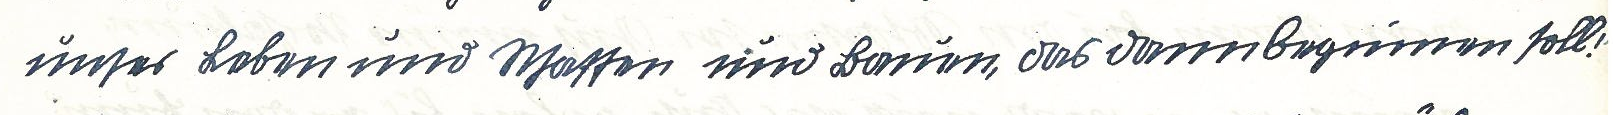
unser Leben und Schaffen und Bauen, das dann beginnen soll!
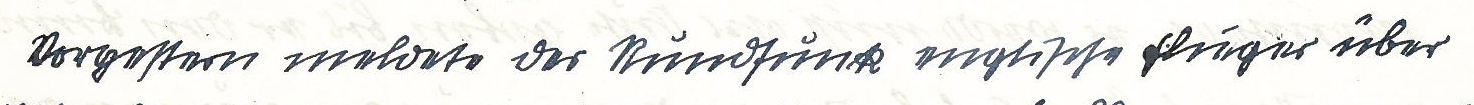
Vorgestern meldete der Rundfunk englische Flieger über
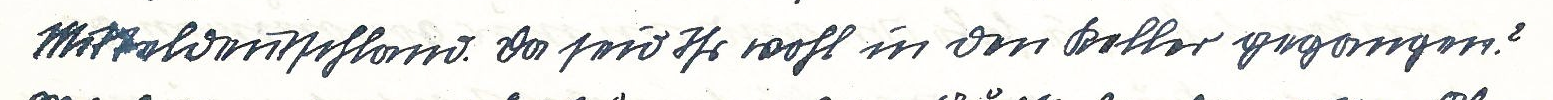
Mitteldeutschland. Da seid Ihr wohl in den Keller gegangen?
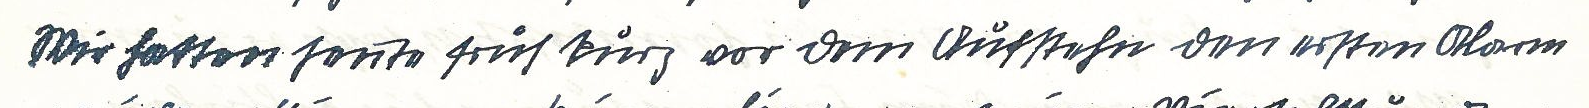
Wir hatten heute früh kurz vor dem Aufstehen den ersten Alarm
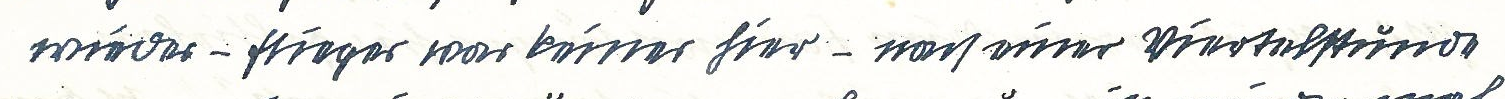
wieder – Flieger waren keine hier – nach einer Viertelstunde
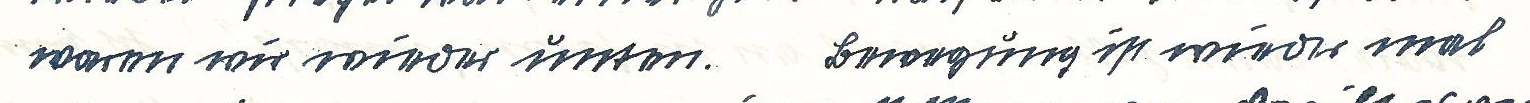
waren wir wieder unten. Bewegung ist wieder mal
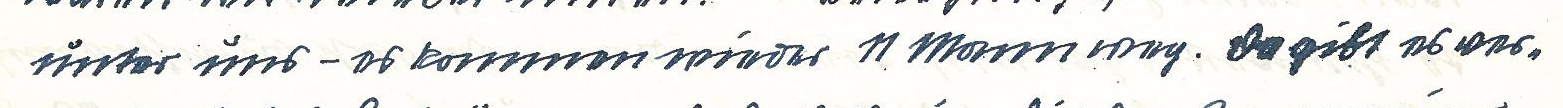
unter uns – es kommen wieder 11 Mann weg. Da gibt es ver¬
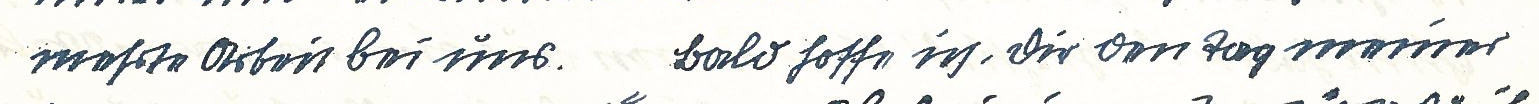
mehrte Arbeit bei uns. Bald hoffe ich, Dir den Tag meiner
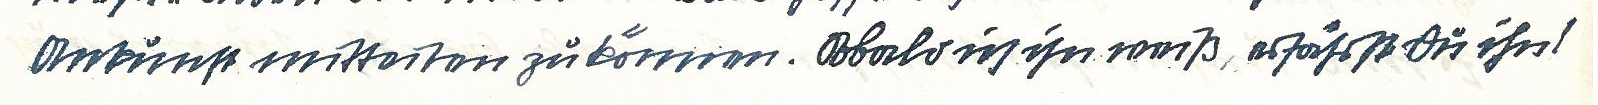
Ankunft mitteilen zu können. Sobald ich ihn weiß, erfährst Du ihn!
